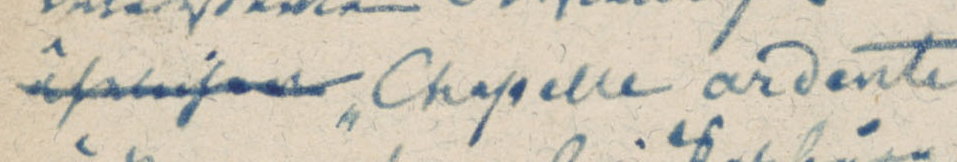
das den Sarg umgab hat man in einem
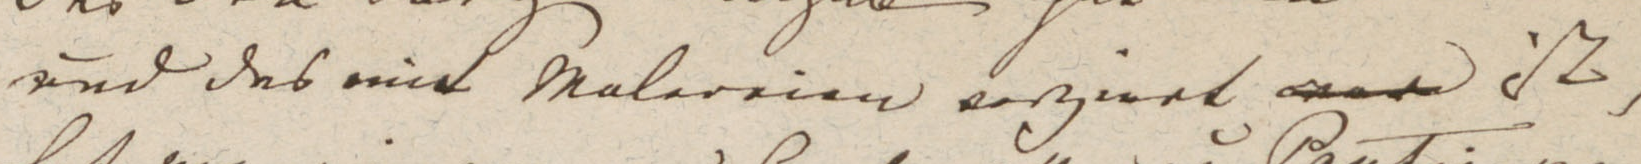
und das mit Malereien verziert war ist,
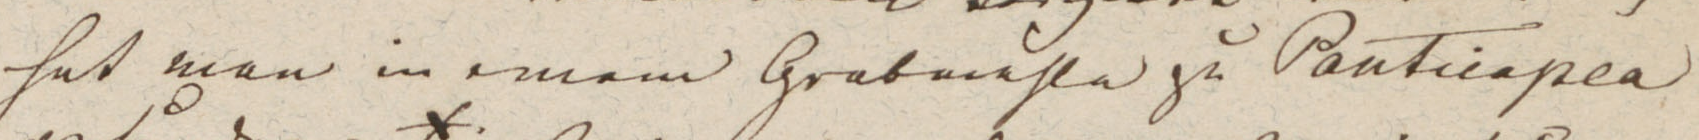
hat man in einem Grabmahle zu Panticapea
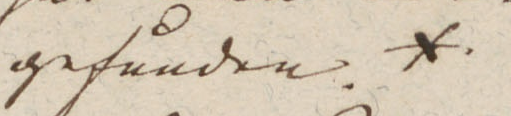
gefunden. %
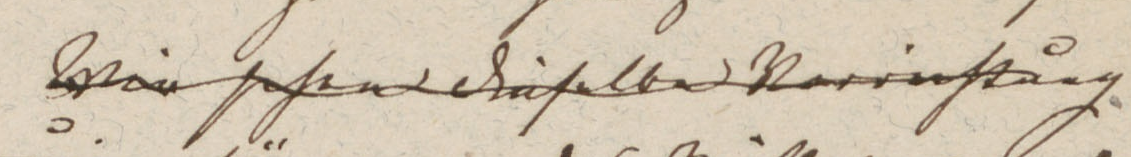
Wir sehen dieselbe Vorrichtung
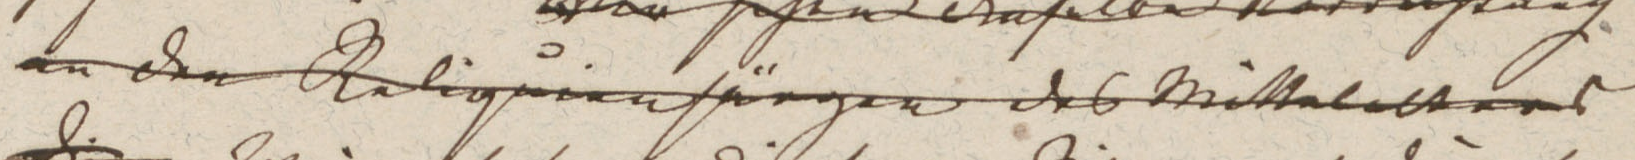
an den Reliquiensärgen des Mittelalters
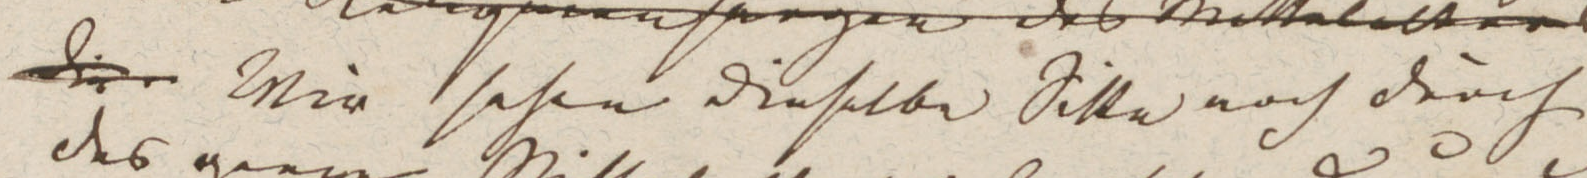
die Wir sehen dieselbe Sitte noch durch
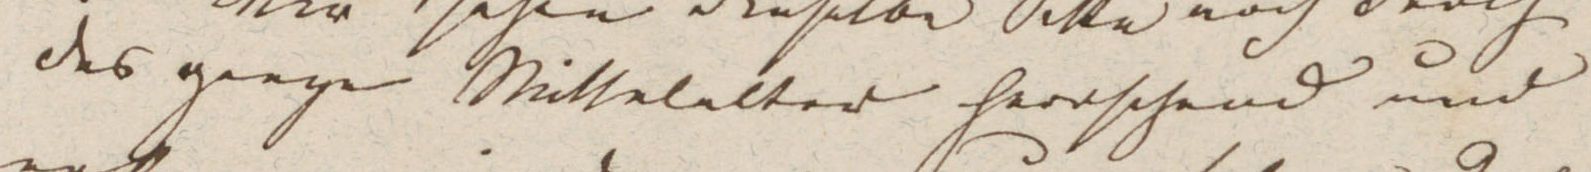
das ganze Mittelalter herrschend und
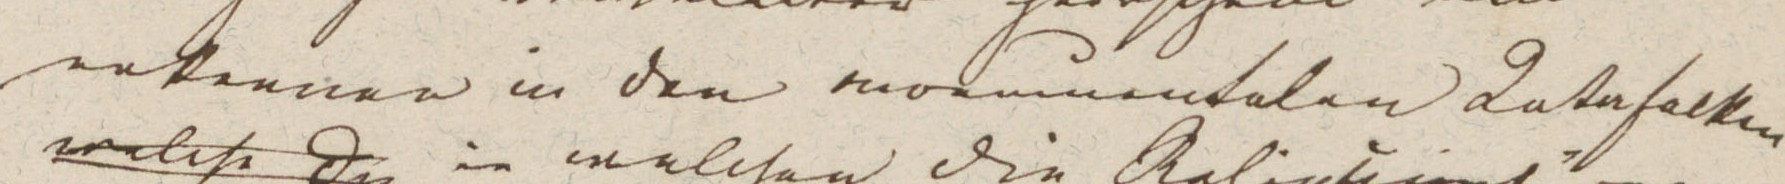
erkennen in den monumentalen Katafalken
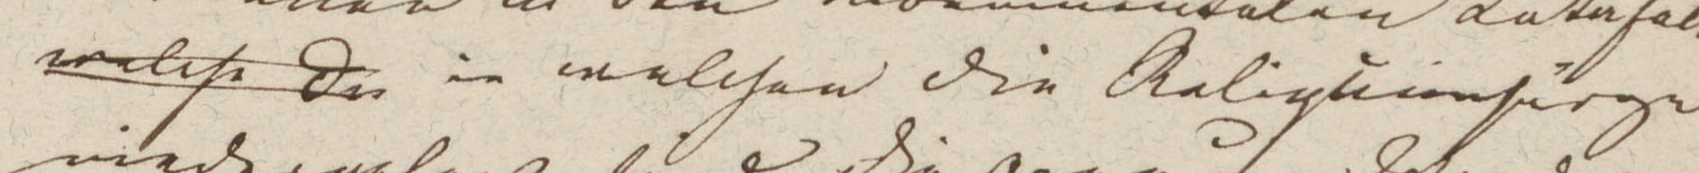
welche die in welchen die Reliquiensärge
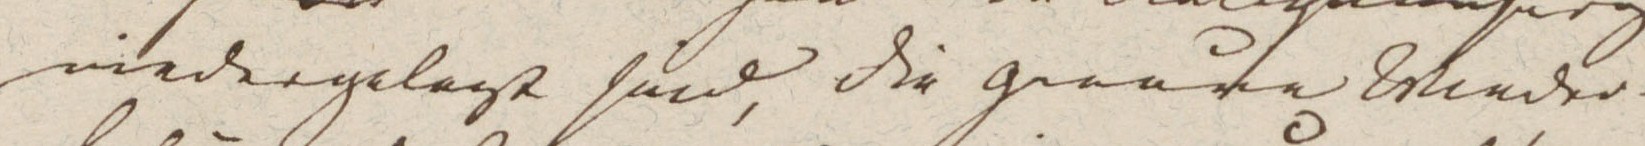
niedergelegt sind, die genaue Wieder-
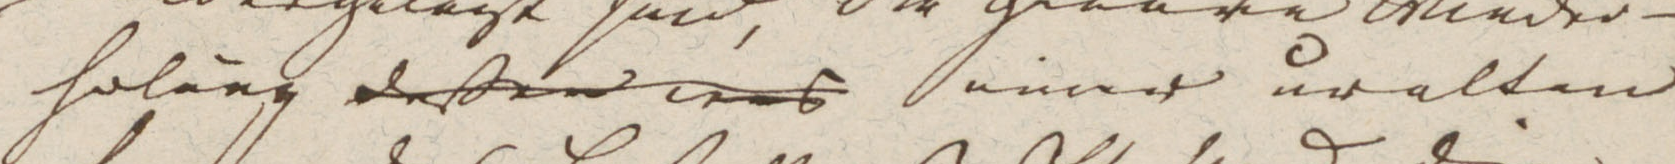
holung dessen was einer uralten
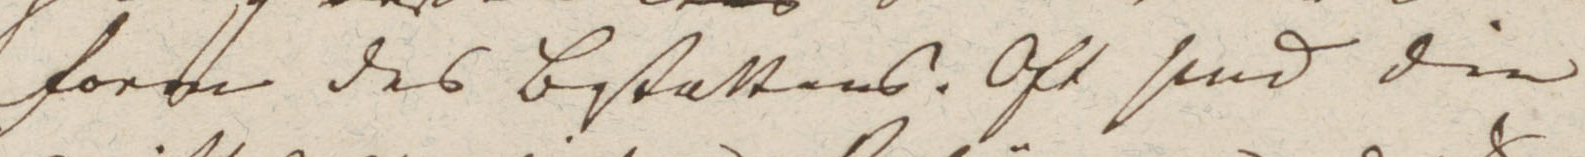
Form des Bestattens. Oft sind die
